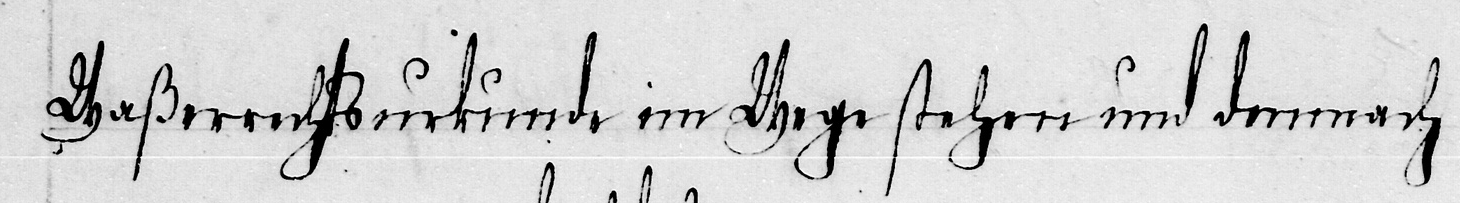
Waßerrechtsurkunde im Wege stehen und demnach
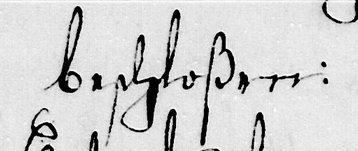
beschloßen:
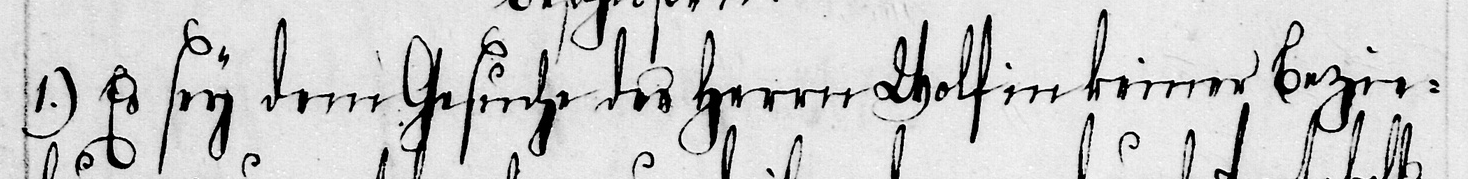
1) Es sey dem Gesuche des Herrn Wolf in keiner Bezie¬
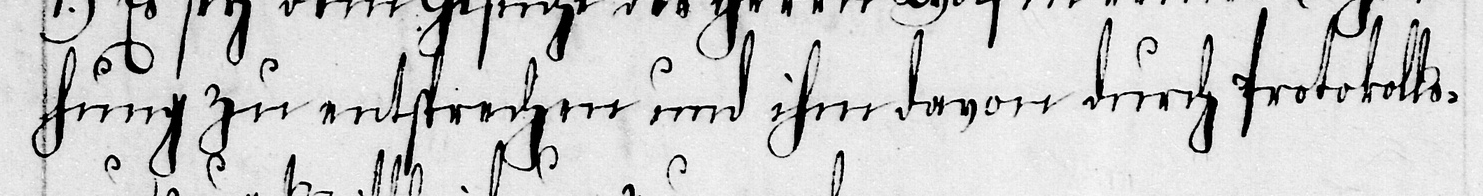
hung zu entsprechen und ihm davon durch Protokolls¬
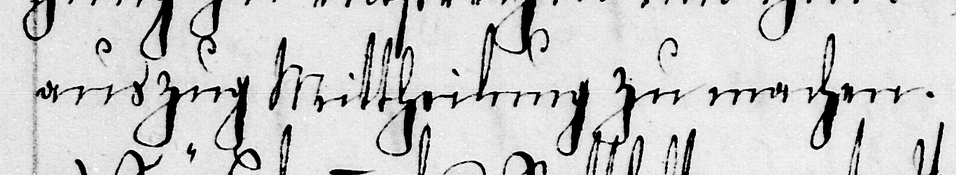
auszug Mittheilung zu machen.
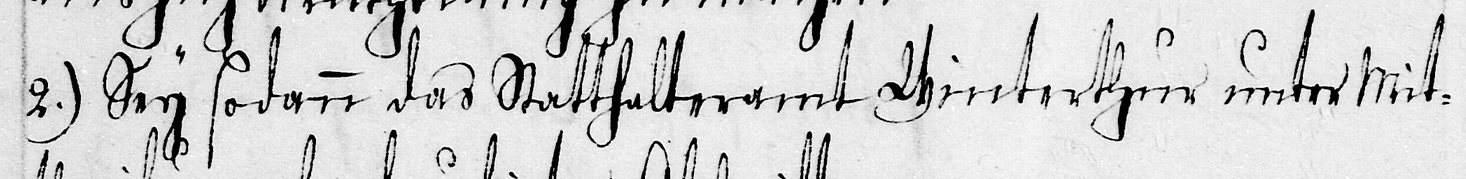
2.) Sey sodann das Statthalteramt Winterthur unter Mit¬
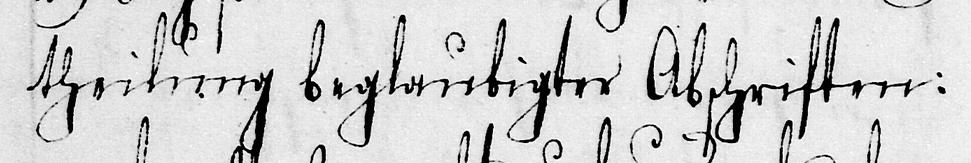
theilung beglaubigter Abschriften:
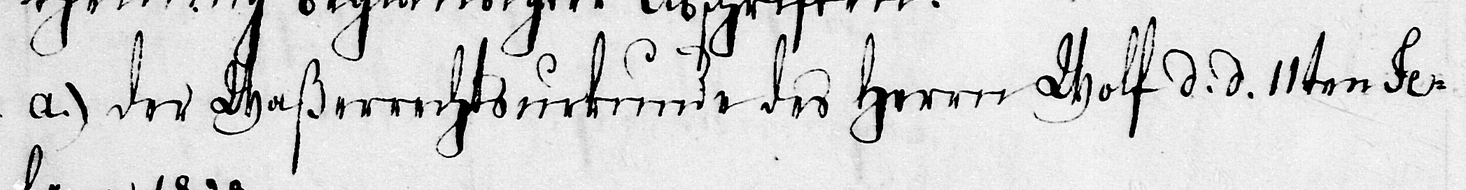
a.) der Waßerrechtsurkunde des Herrn Wolf d. d. 11ten. Fe¬
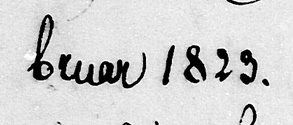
bruar 1823.
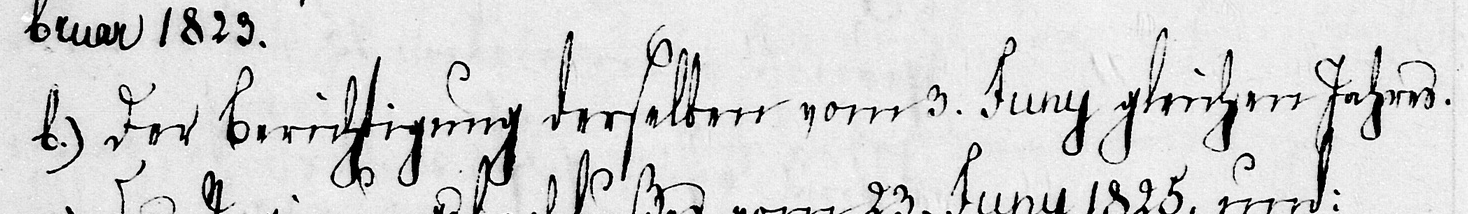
b.) Der Berichtigung derselben vom 3. Juny gleichen Jahres.
